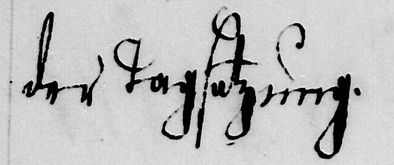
der Meinung
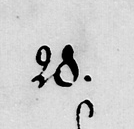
23.
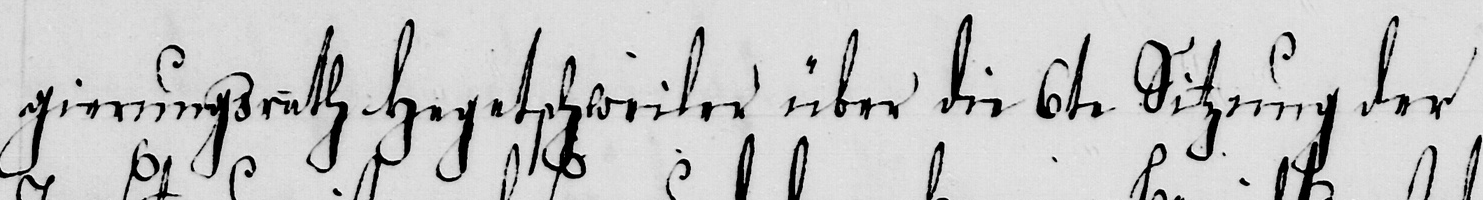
gierungsrath Hegetschweiler über die 6te Sitzung der
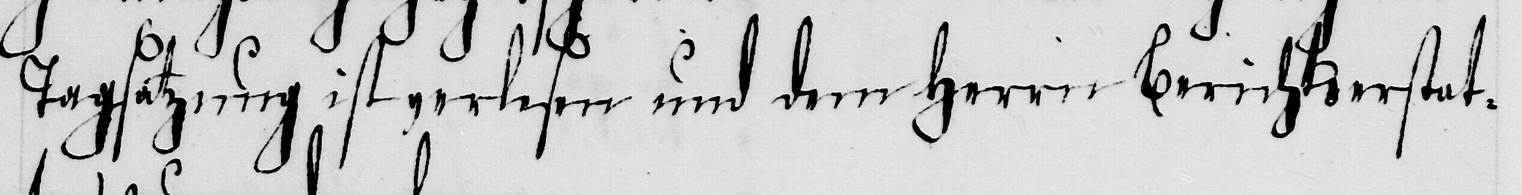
Tagsatzung ist verlesen und dem Herrn Berichterstat¬
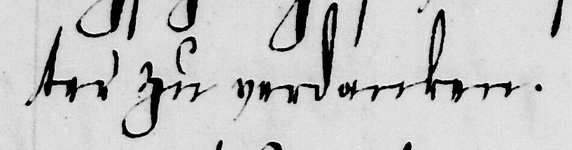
ter zu verdanken.
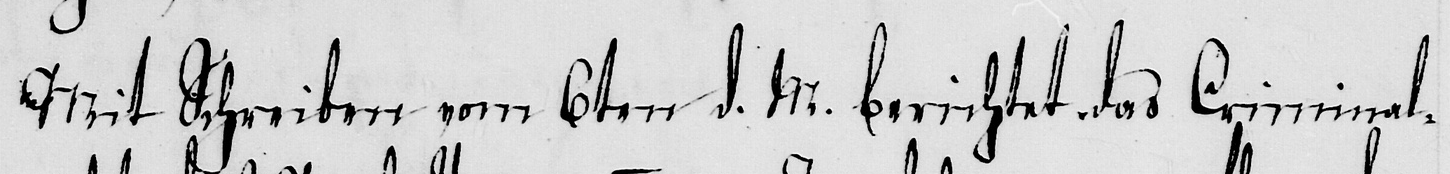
Mit Schreiben vom 6ten d. M. berichtet das Criminal¬
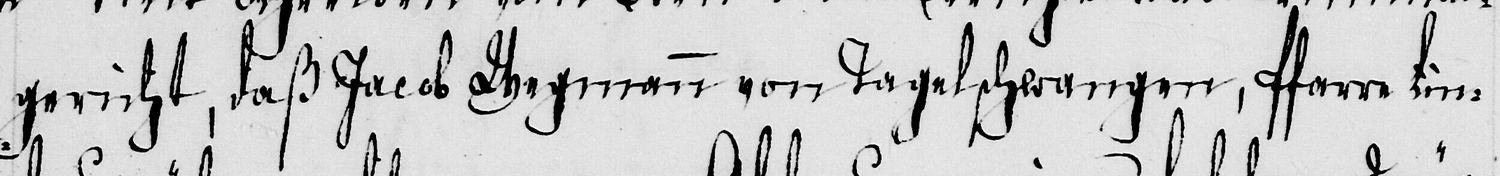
gericht, daß Jacob Wegmann von Tagelschwangen, Pfarre Lin¬
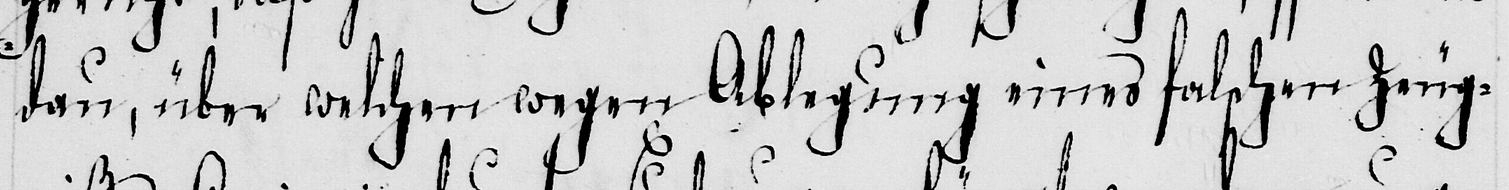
dau, über welchen wegen Ablegung eines falschen Zeug¬
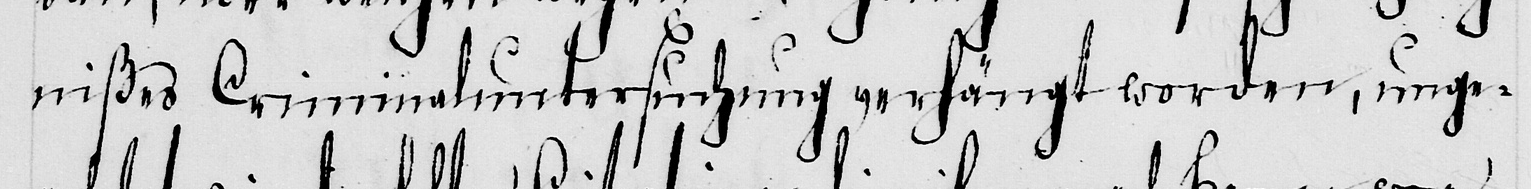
nißes Criminaluntersuchung verhängt worden, unge¬
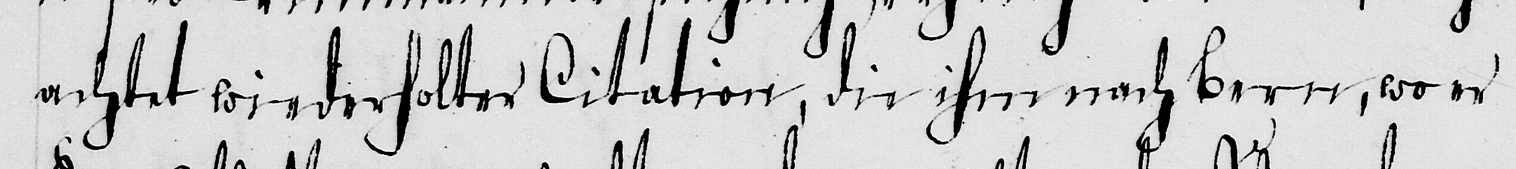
achtet wiederholter Citation, die ihm nach Bern, wo er
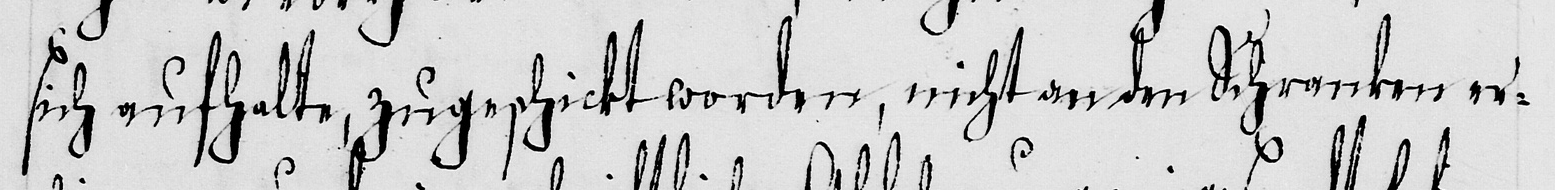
sich aufhalte, zugeschickt worden, nicht an den Schranken er¬
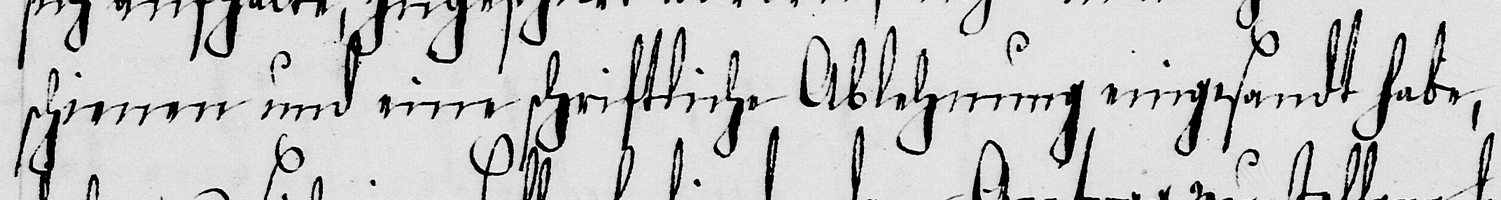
schienen und eine schriftliche Ablehnung eingesandt habe,
